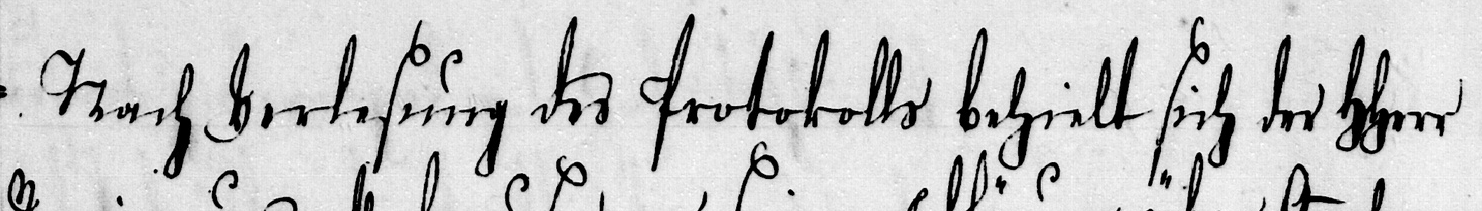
Nach Verlesung des Protokolls behielt sich der
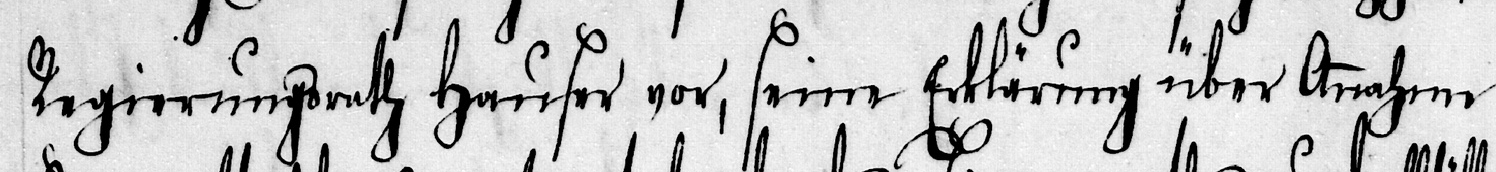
Regierungsrath Hauser vor, seine Erklärung über Annahme
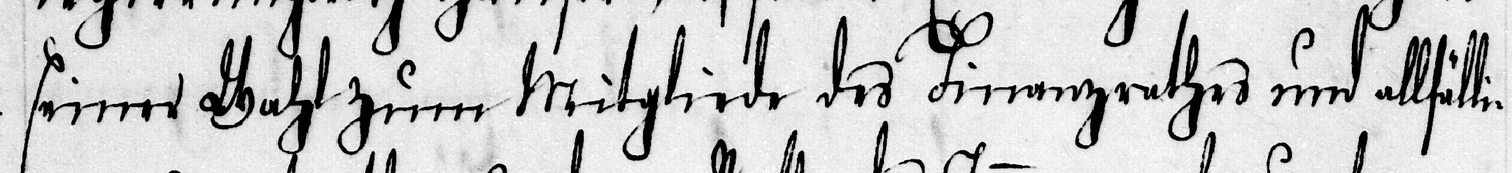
seiner Wahl zum Mitgliede des Finanzrathes und allfäl¬
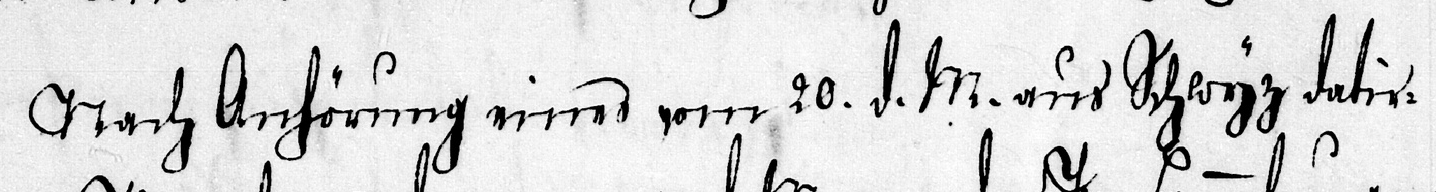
Nach Anhörung eines vom 20. d. M. aus Schwyz datir¬
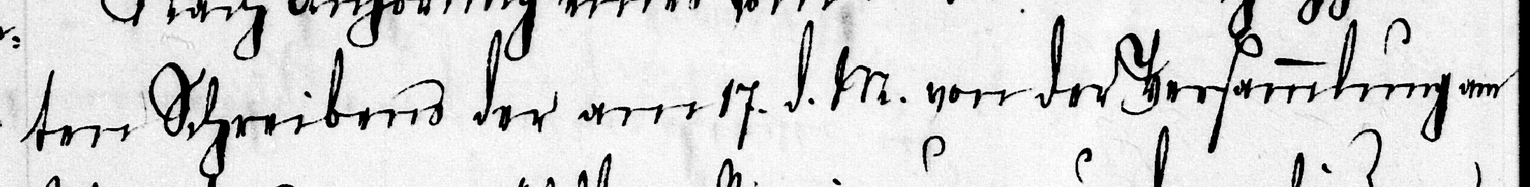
ten Schreibens der am 17. d. M. von der Versammlung am
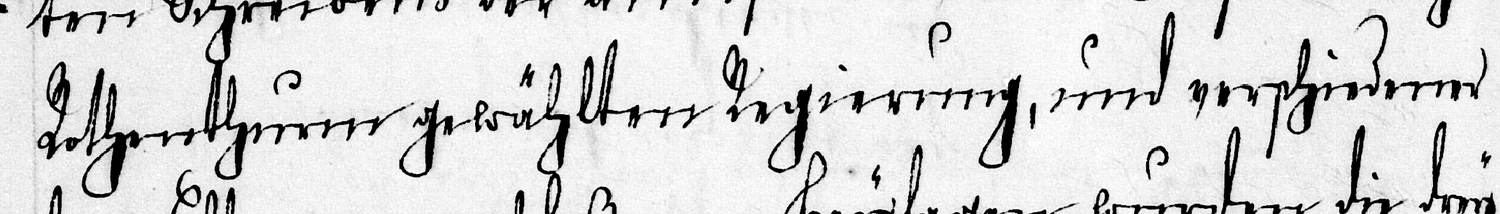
Rothenthurm gewählten Regierung, und verschiedener
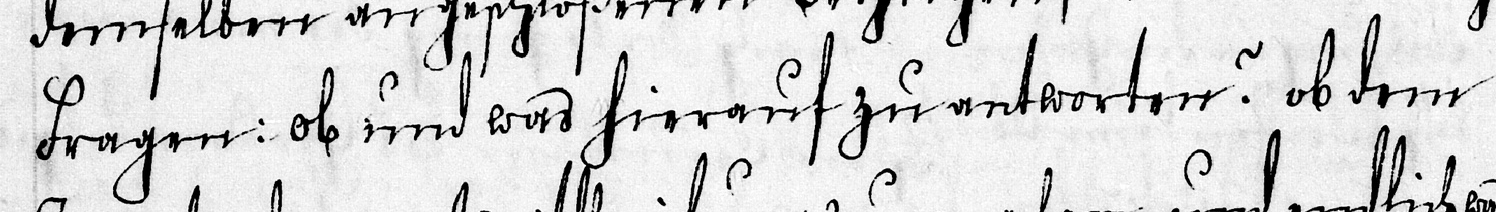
Fragen: ob und was hierauf zu antworten? ob dem
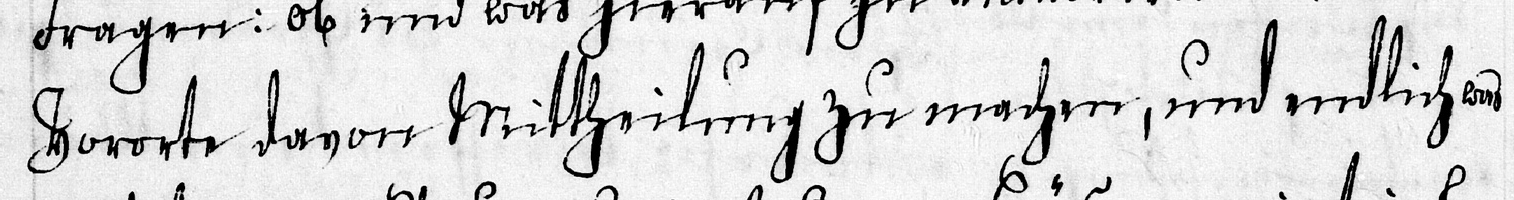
Vororte davon Mittheilung zu machen, und endlich w¬
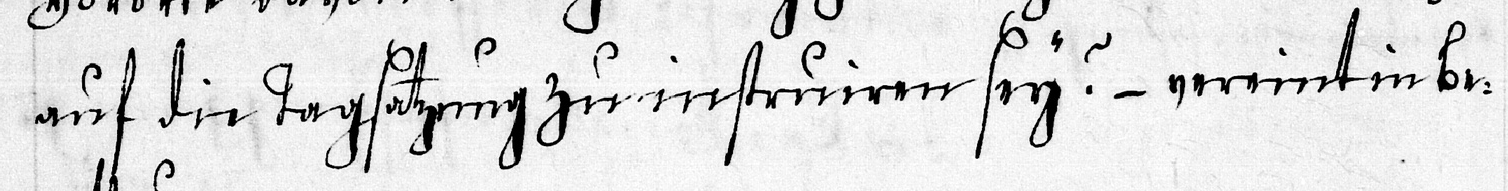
auf die Tagsatzung zu instruiren sey? – vereint in Be¬
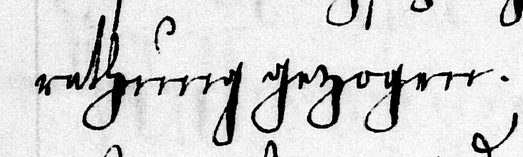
rathung gezogen.
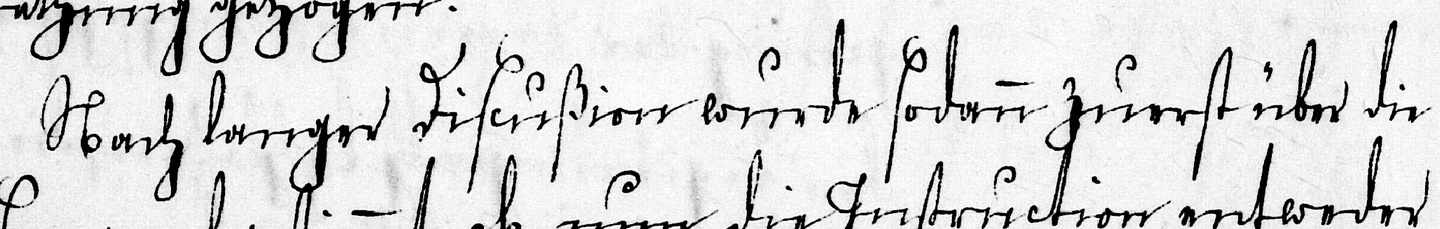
Nach langer Discußion wurde sodann zuerst über die
